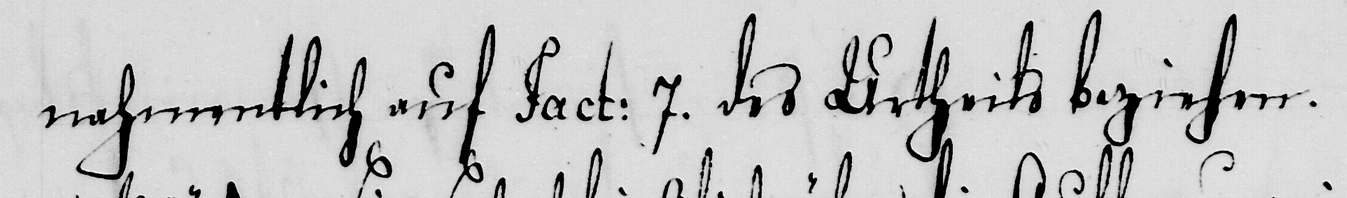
nahmentlich auf Fact: 7. des Urtheils beziehen.
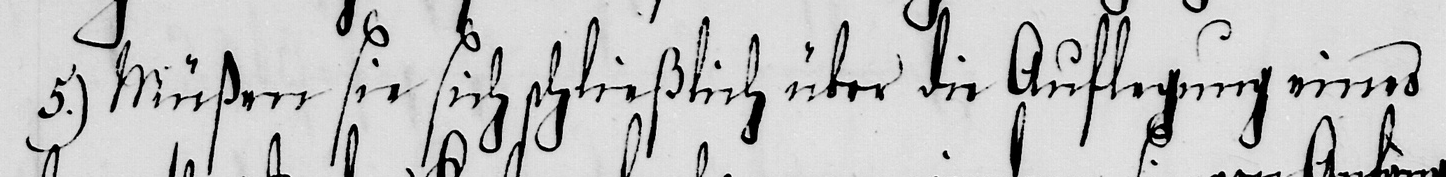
5.) Müßen sie sich schließlich über die Auflegung eines
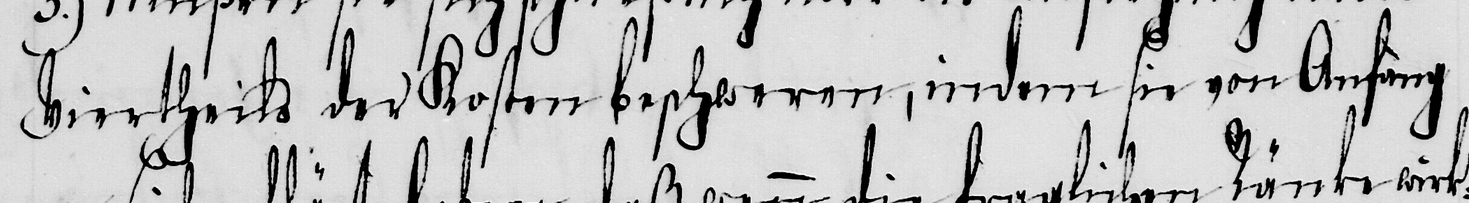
Viertheils der Kosten beschweren, indem sie von Anfang
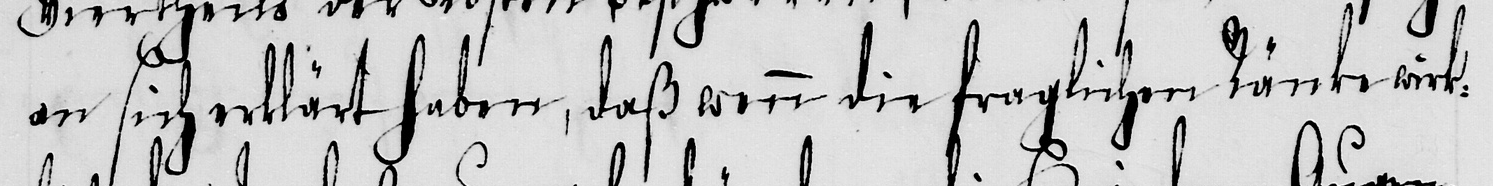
an sich erklärt haben, daß wenn die fraglichen Ränke wirk¬
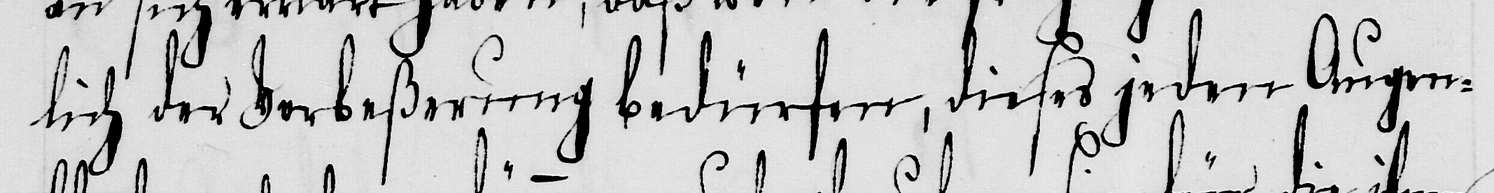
lich der Verbeßerung bedürfen, dieses jeden Augen¬
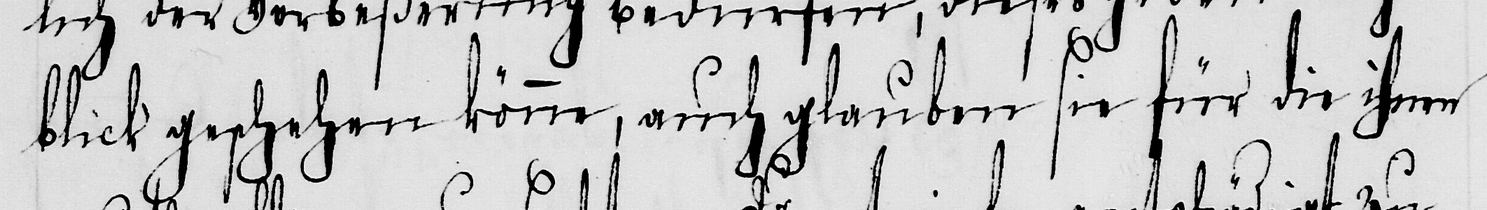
blick geschehen könne, auch glauben sie für die ihnen
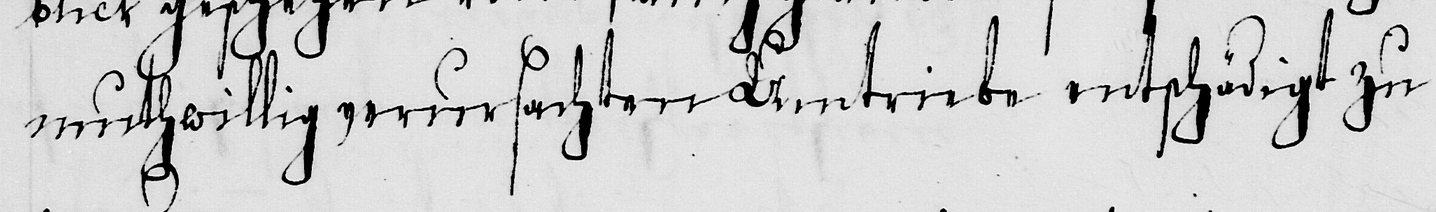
muthwillig verursachten Umtriebe entschädigt zu
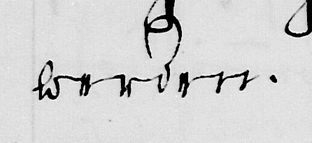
werden.
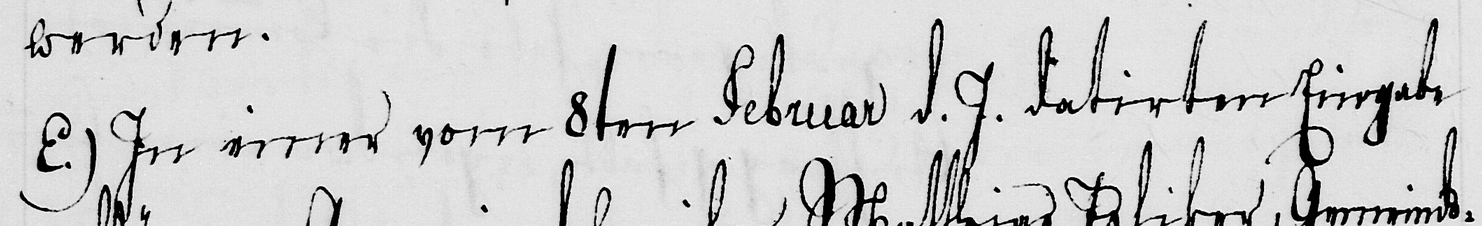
E.) In einer vom 8ten Februar d. J. datirten Eingabe
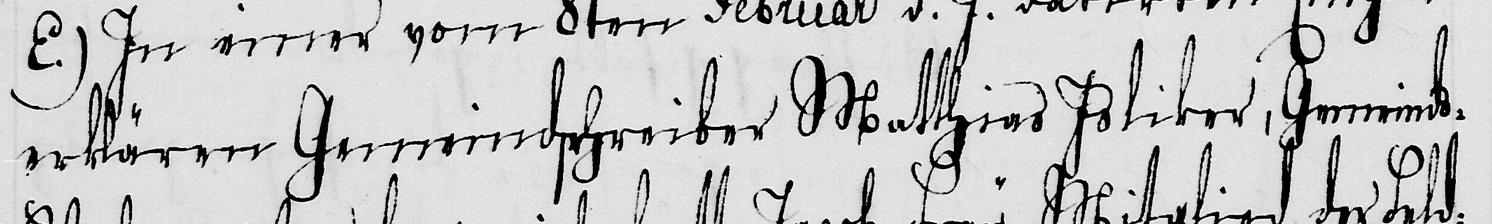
erklären Gemeindschreiber Matthias Isliker, Gemeind¬
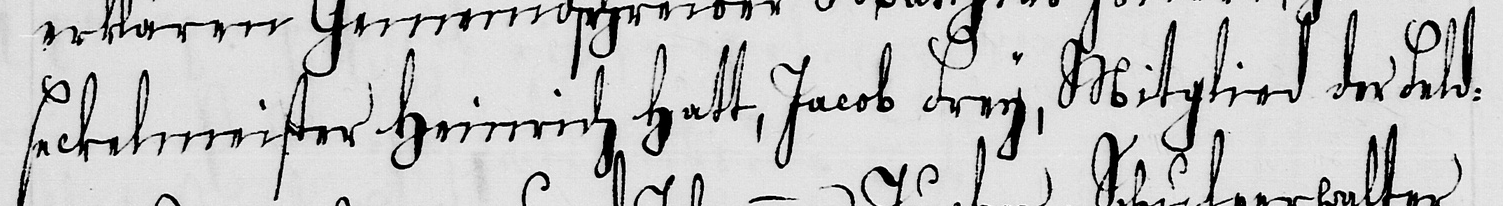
seckelmeister Heinrich Hatt, Jacob Frey, Mitglied der Fel¬
